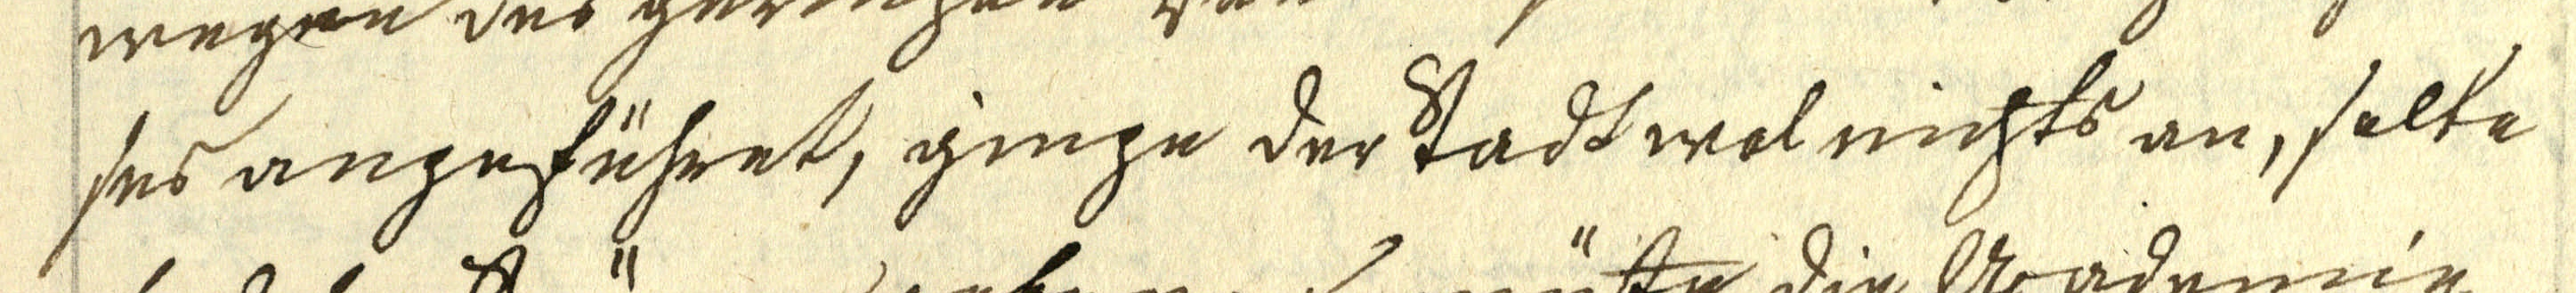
ses angeführet, ginge der Stadt wol nichts an, solte
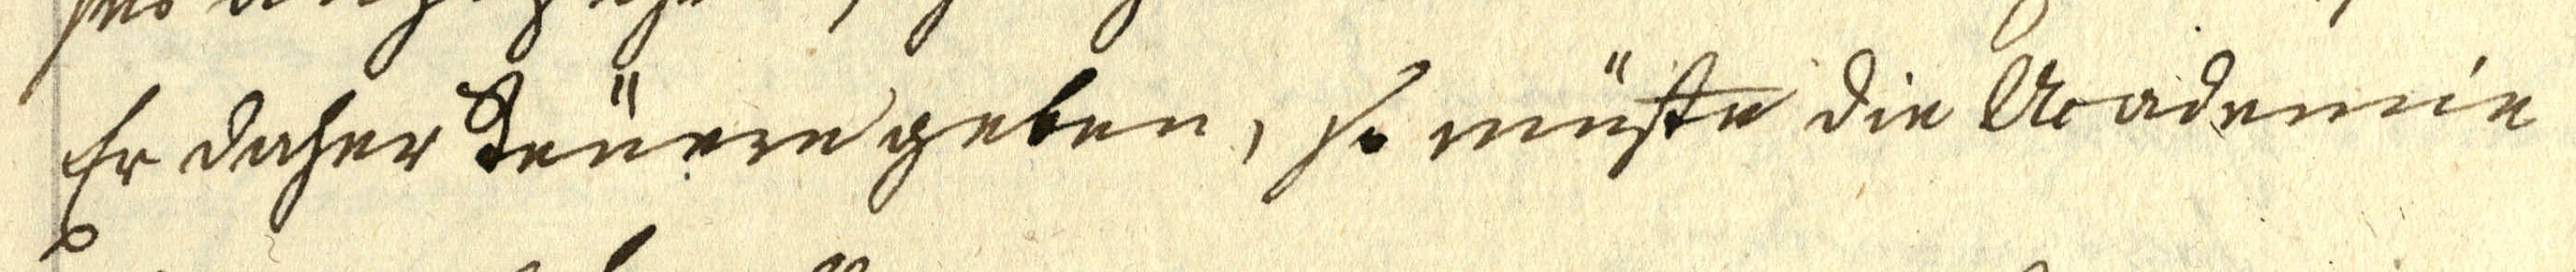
Er daher Steuern geben, so müste die Academie
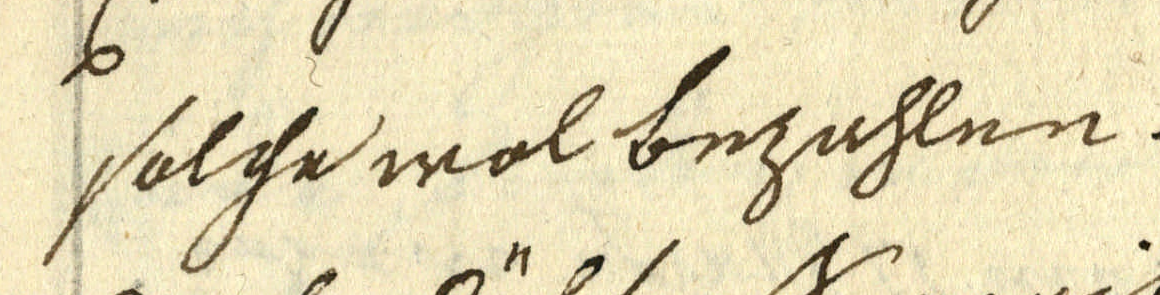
solche wol bezahlen.
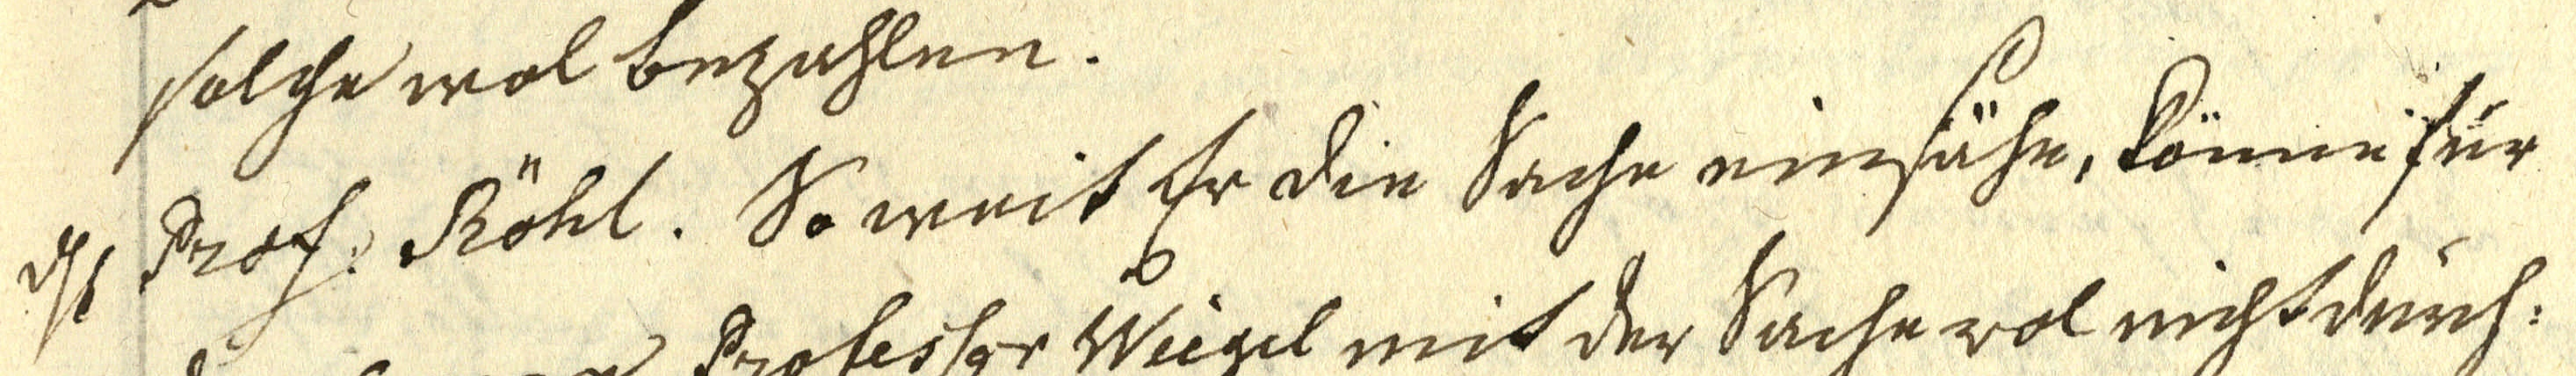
dh Prof. Röhl. Soweit Er den Sache einsähe, könne für
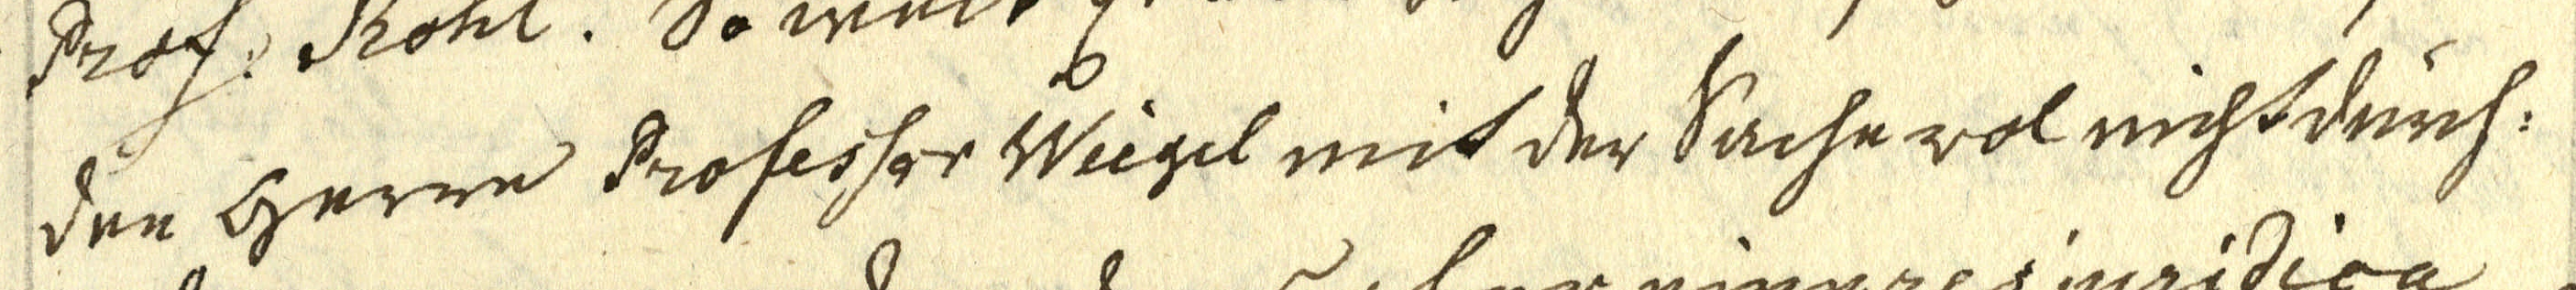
den Herrn Professor Weigel mit der Sache wol nicht durch¬
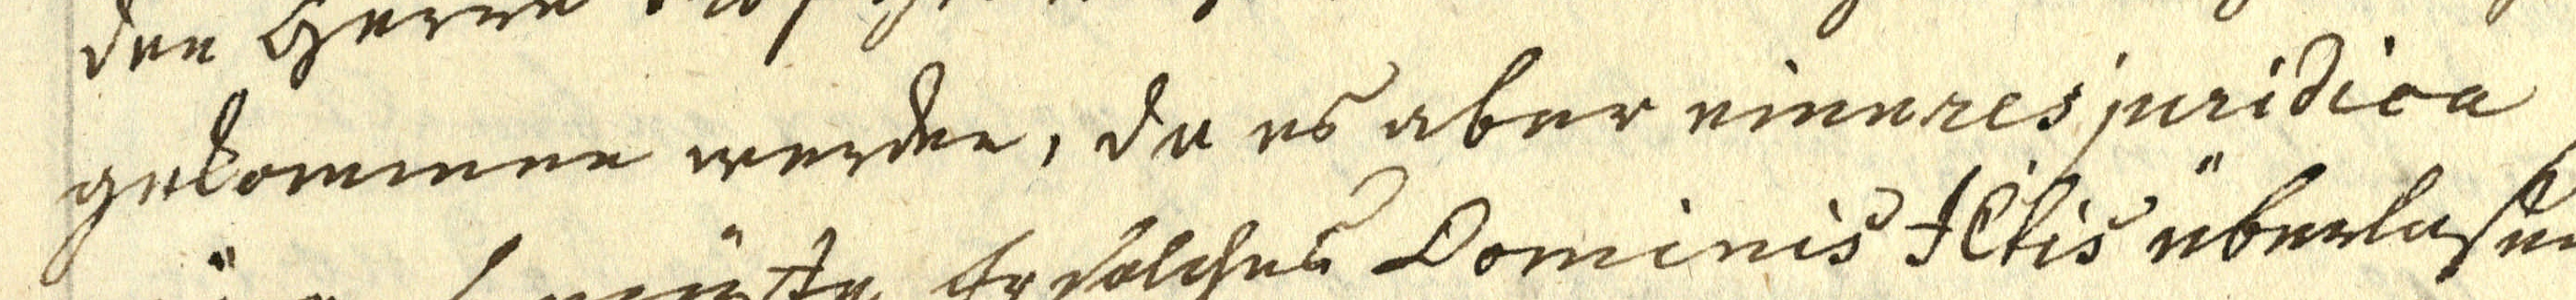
gekommen werden, da es aber eine res juridica
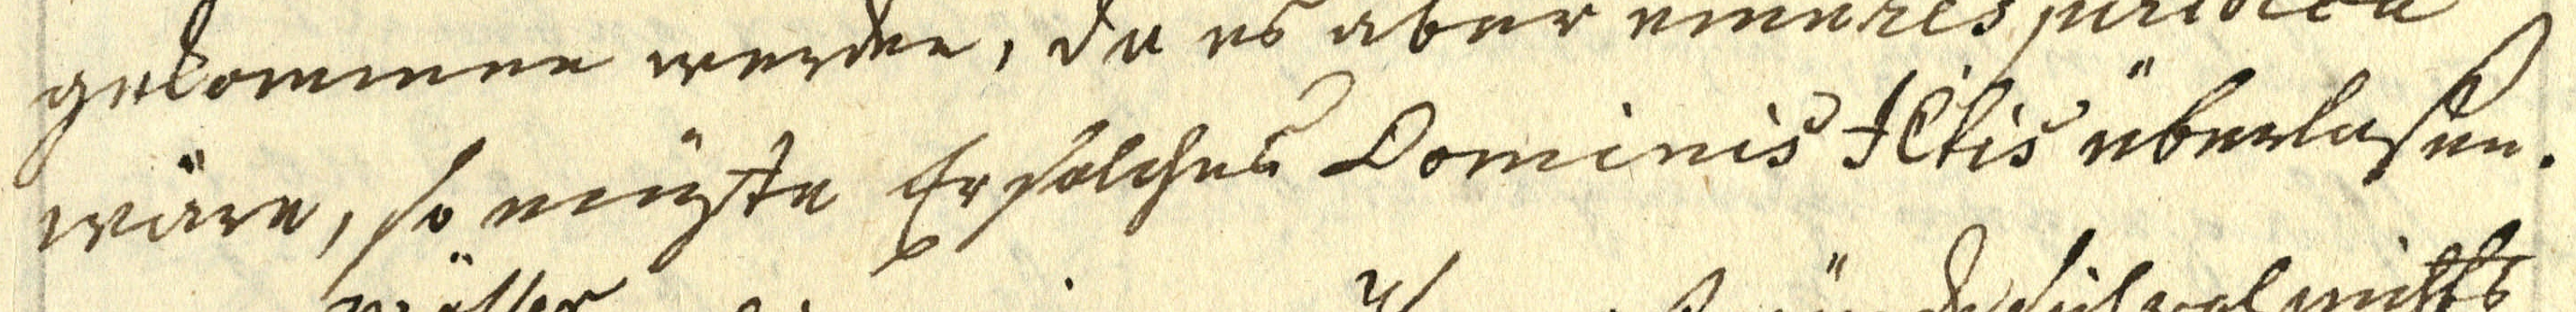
wäre, so müste Er solches Dominis Ictis überlaßen.
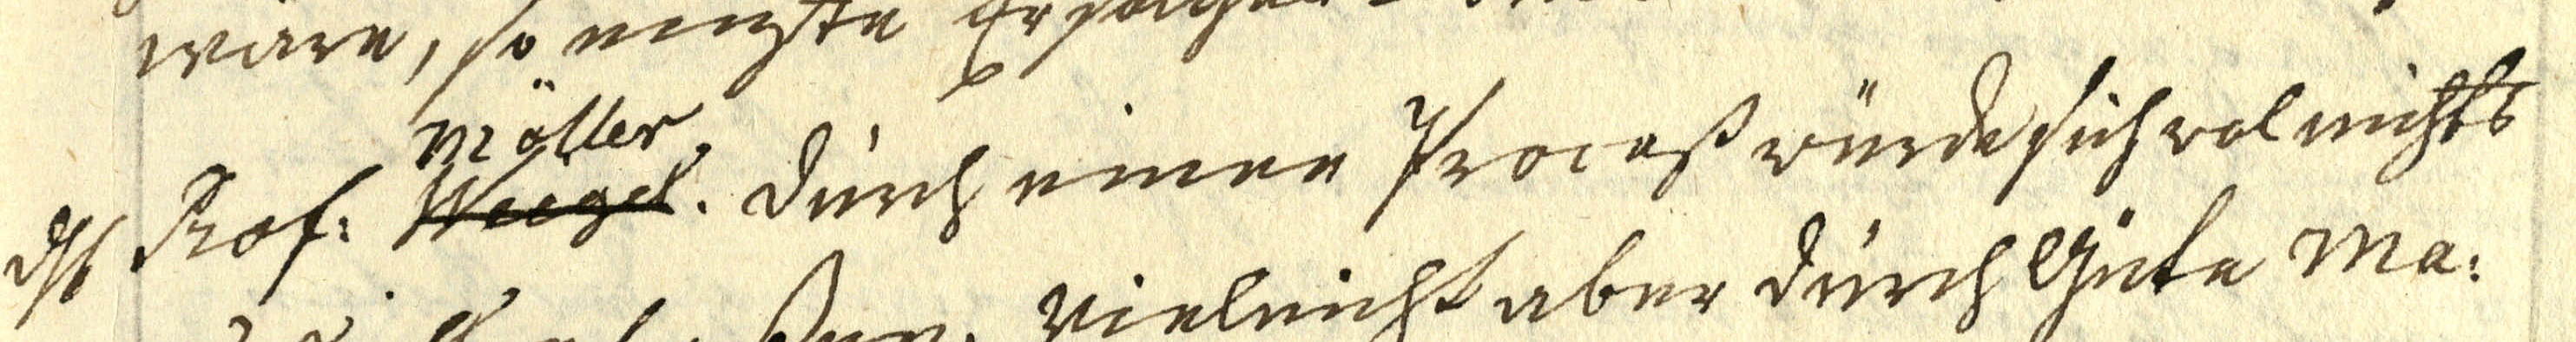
dh Prof. Möller. Durch einen Proceß würde sich wol nichts
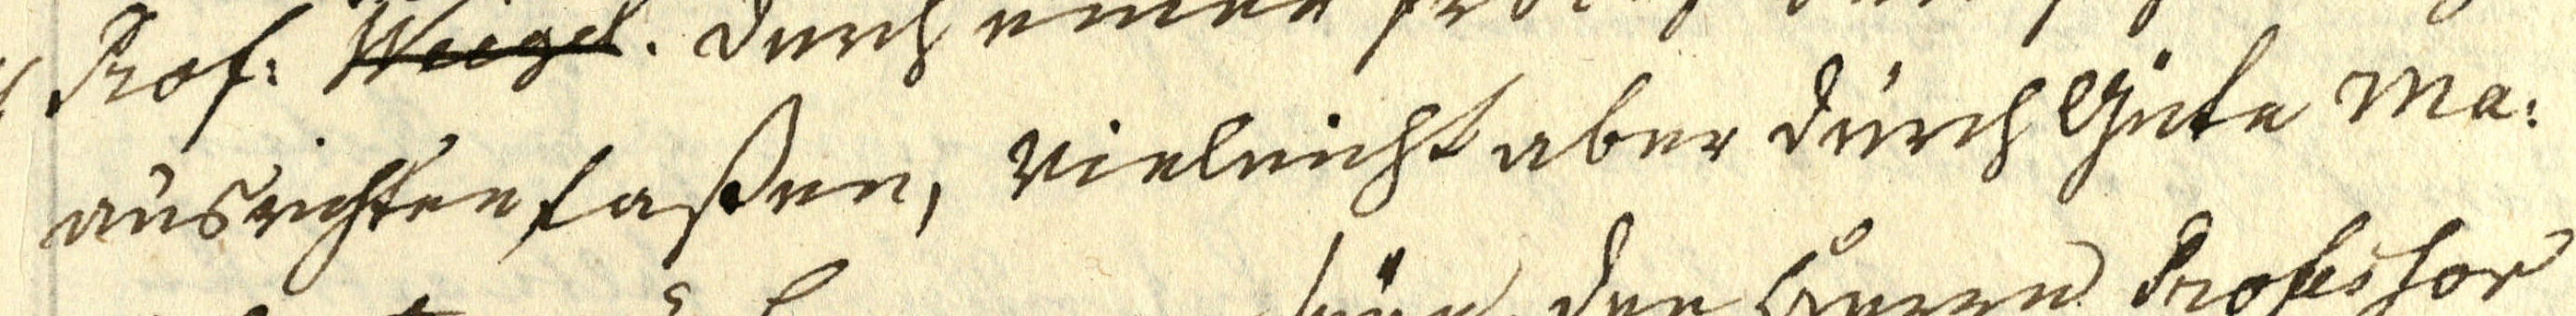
ausrichten laßen, vieleicht aber durch Güte Ma¬
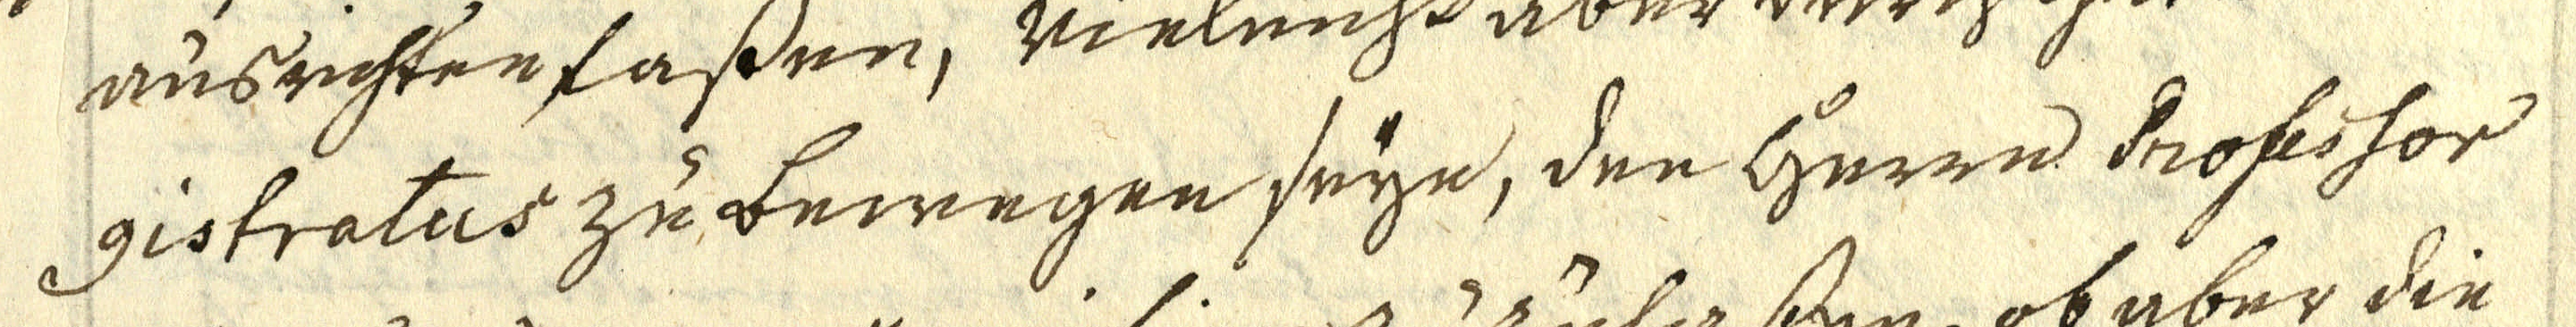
gistratus zu bewegen seÿn, den Herrn Professor
